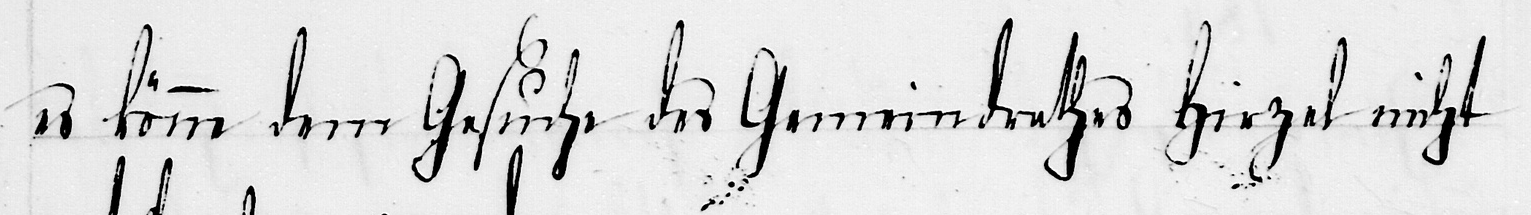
es könne dem Gesuche des Gemeindrathes Hirzel nicht
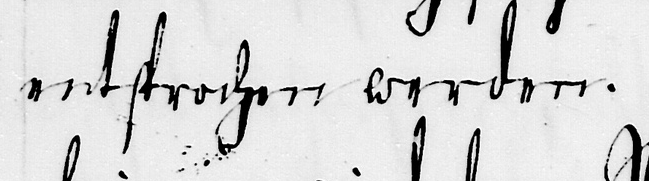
entsprochen werden.
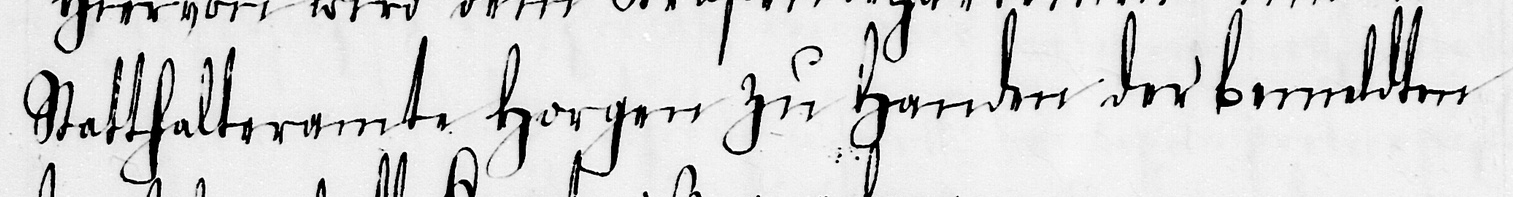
Statthalteramte Horgen zu Handen der bemeldten
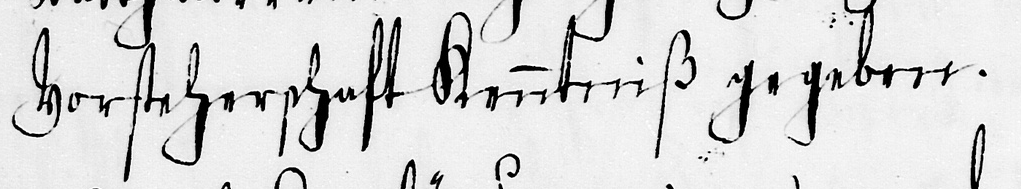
Vorsteherschaft Kenntniß gegeben.
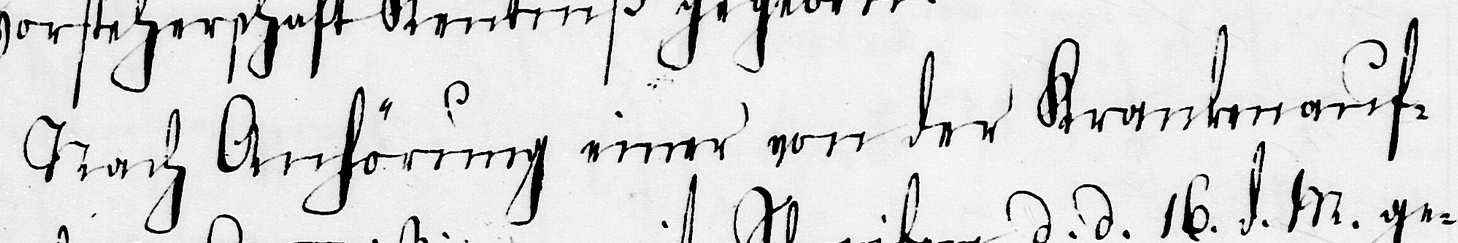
Nach Anhörung einer von der Krankenauf¬
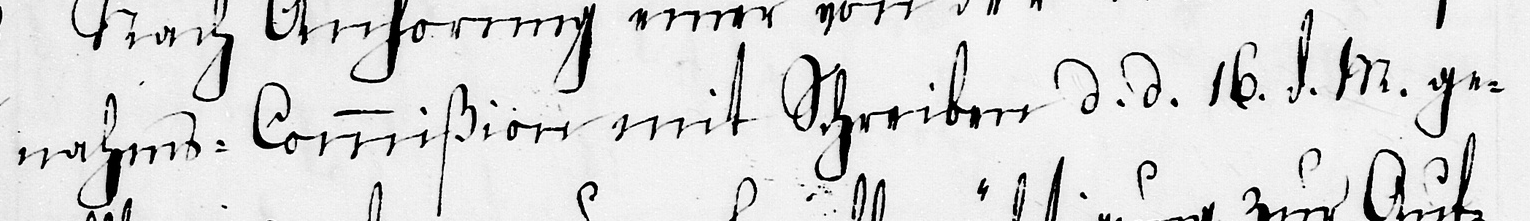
nahms-Commißion mit Schreiben d. d. 16. d. M. ge¬
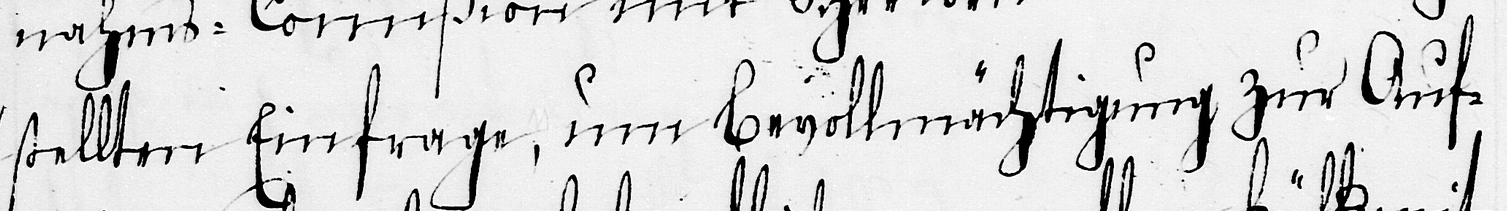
stellten Einfrage, um Bevollmächtigung zur Auf¬
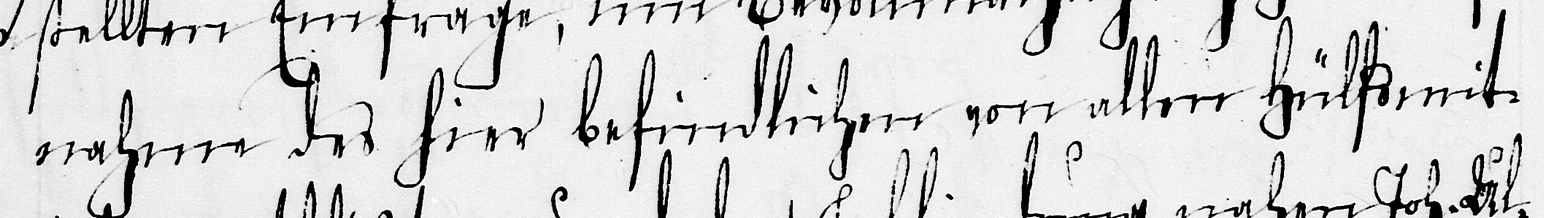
nahme des hier befindlichen von allen Hülfsmit¬
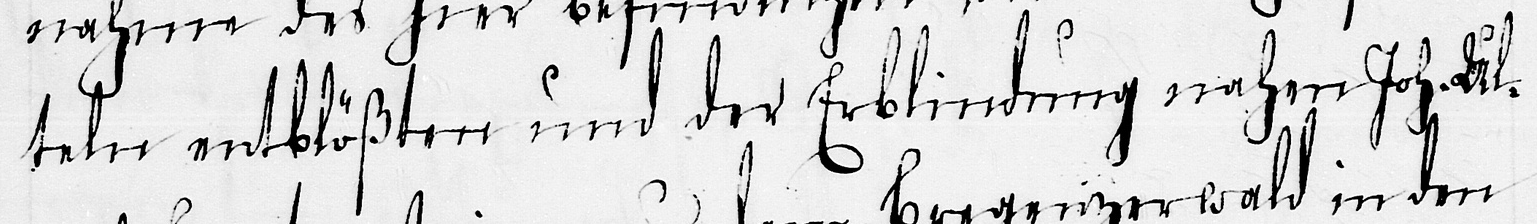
teln entblößten und der Erblindung nahen Joh. Ul¬
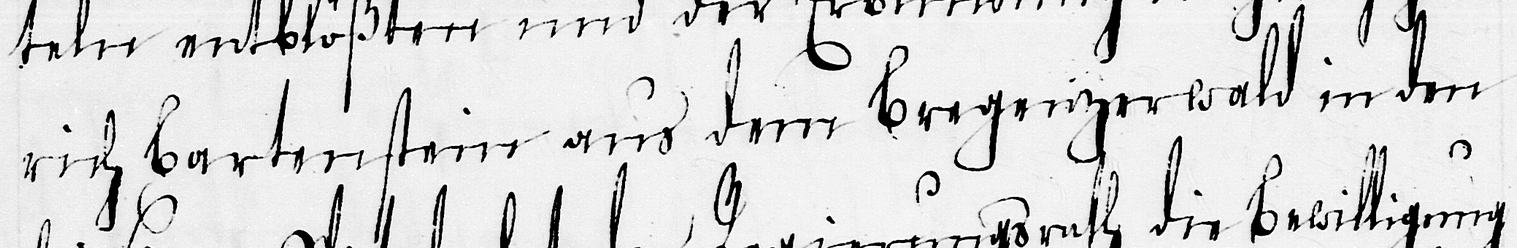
rich Bartenstein aus dem Bregenzerwald in den
